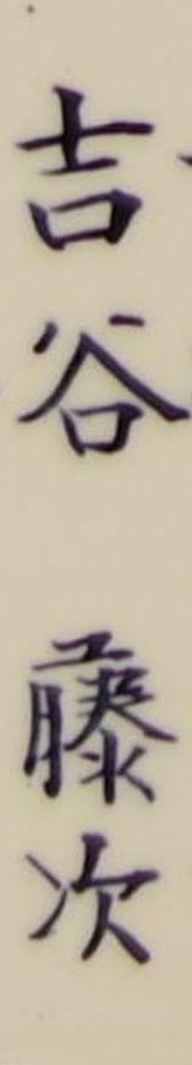吉谷藤次
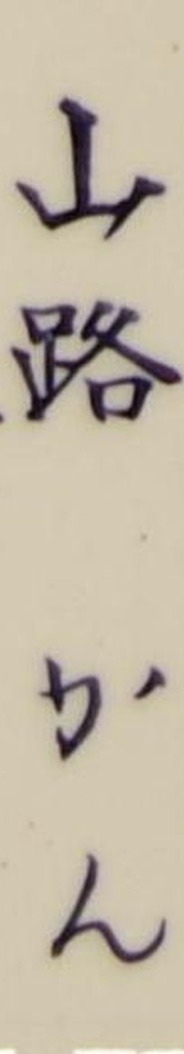山路かん
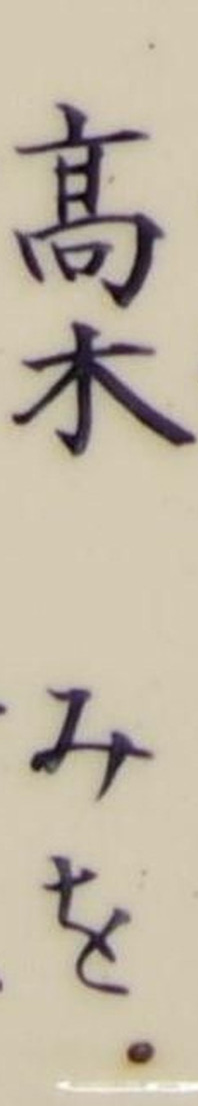高木みを
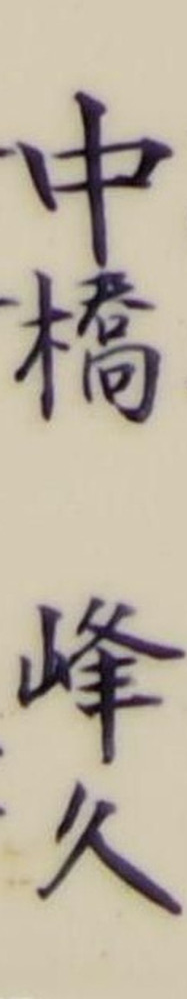中橋峰久
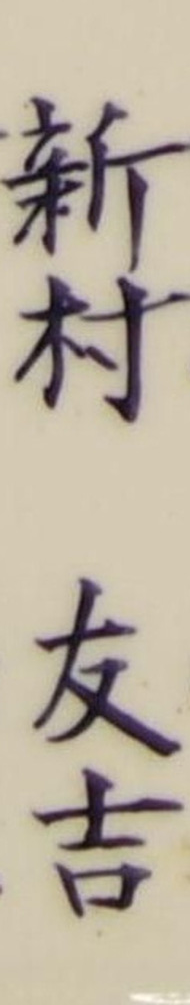新村友吉
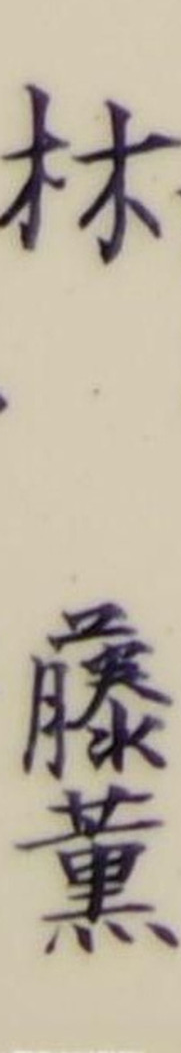林藤薫
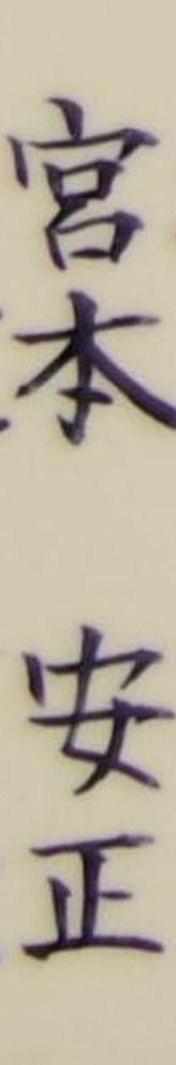宮本安正
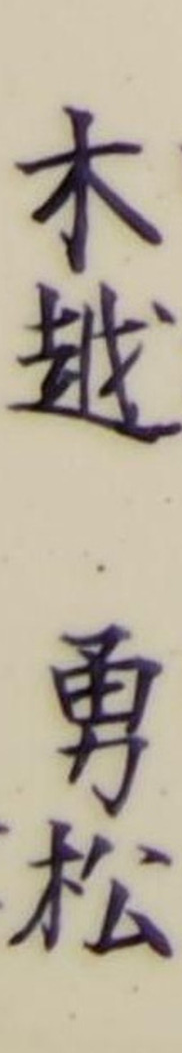木越勇松

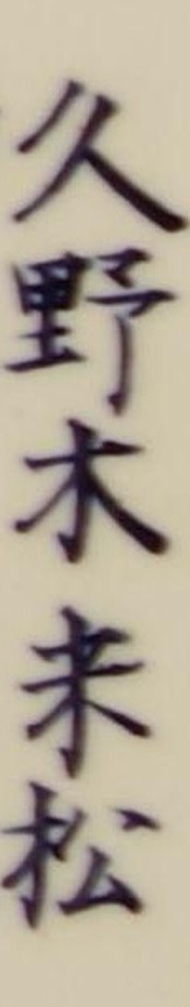久野木未松
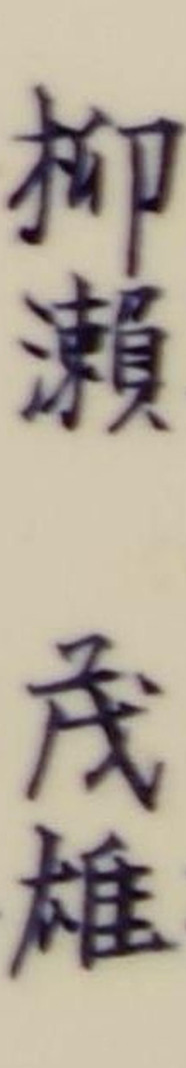柳瀬茂雄
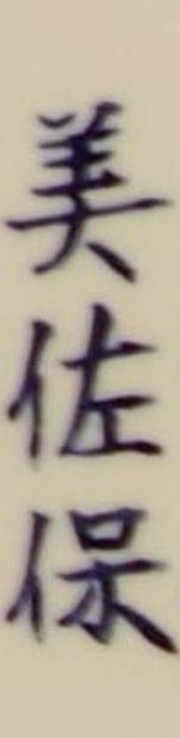美佐保
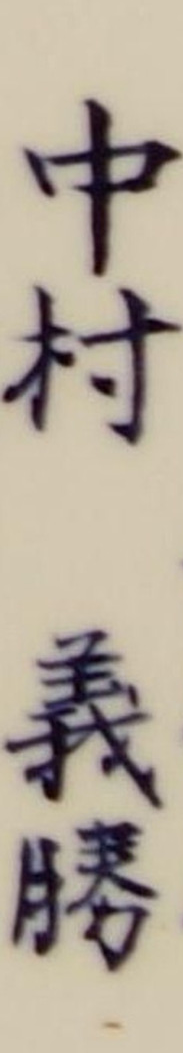中村義勝
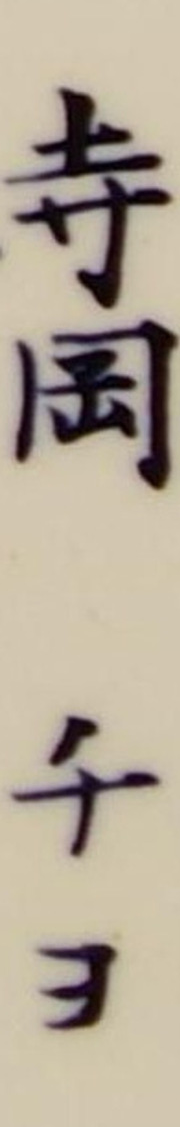寺岡チヨ
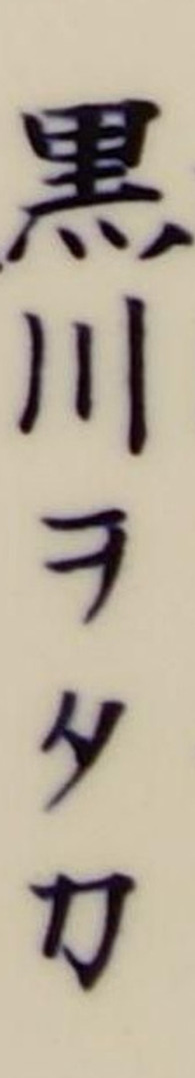黒川ヲタカ
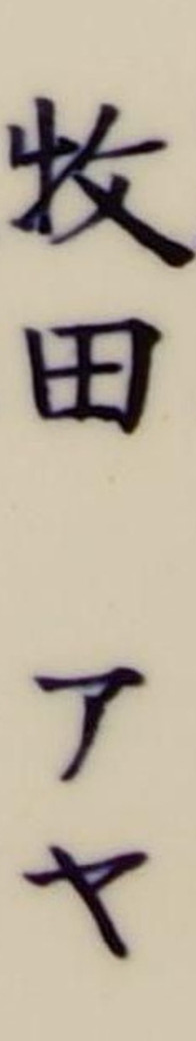牧田アヤ
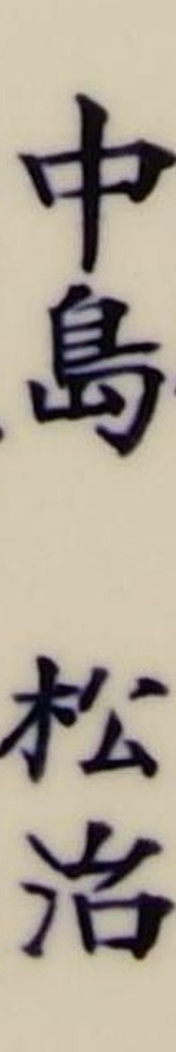中島松治
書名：A~D
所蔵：koyasan kongobuji
